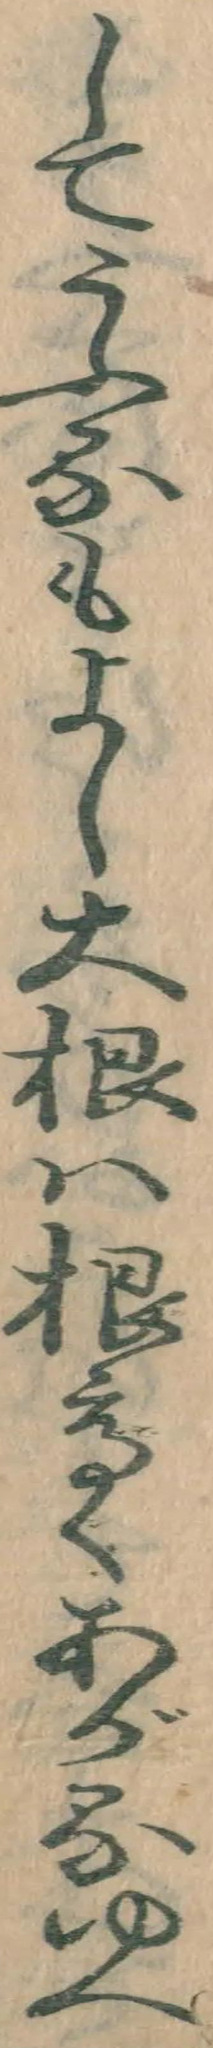してうふるもよし大根は根高くあがるゆへ

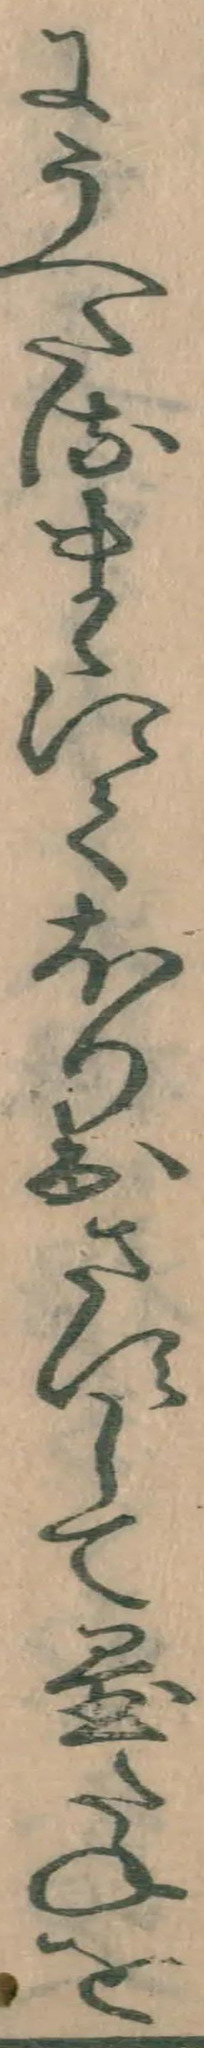にうへたるまゝにてほり出さすして置たねを
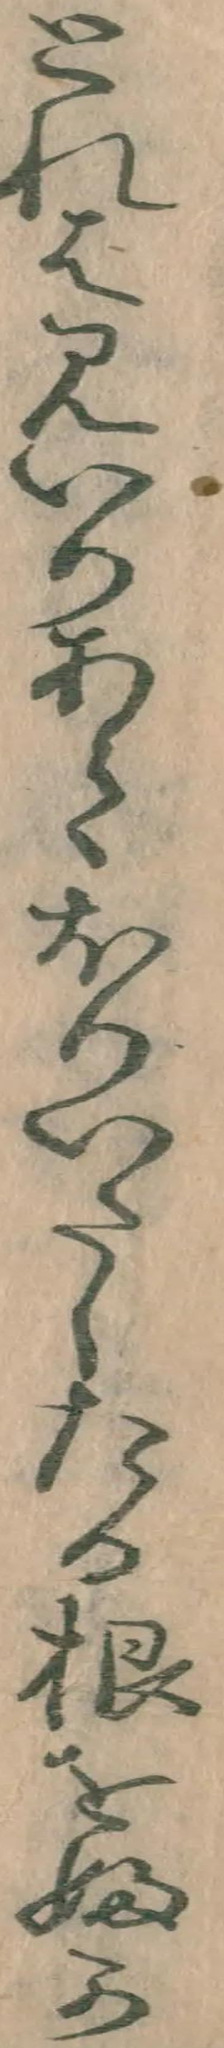とれは見いりあしゝほりいたしたる根をふか
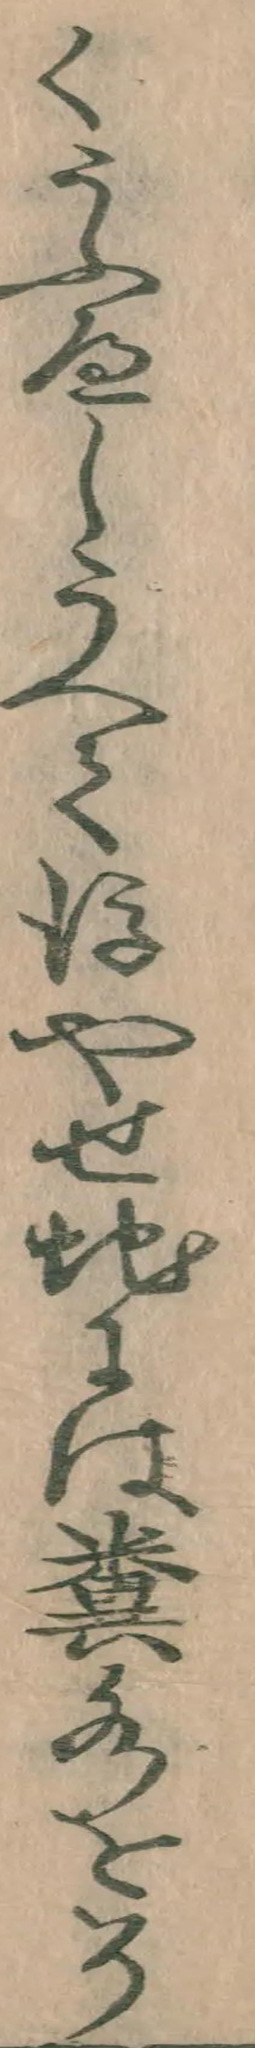くうふへしうへて後やせ地には糞水をそ
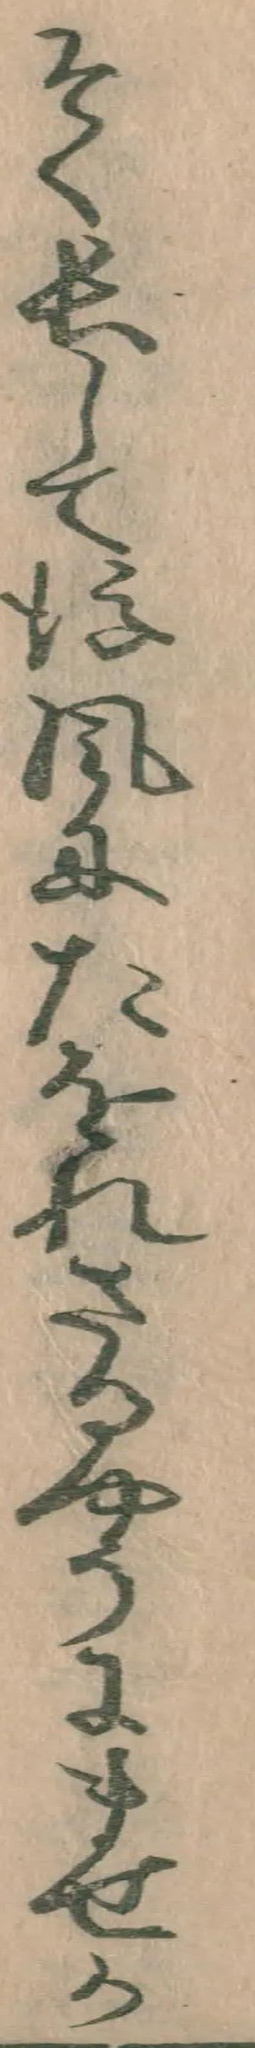そく長して後風にたをれさるやうにませか
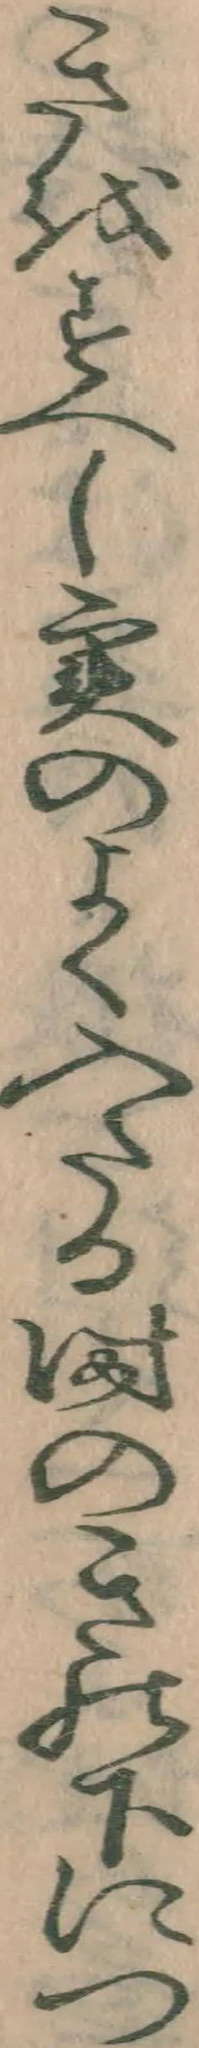きをすへし実のよく入たる時のきの下につ
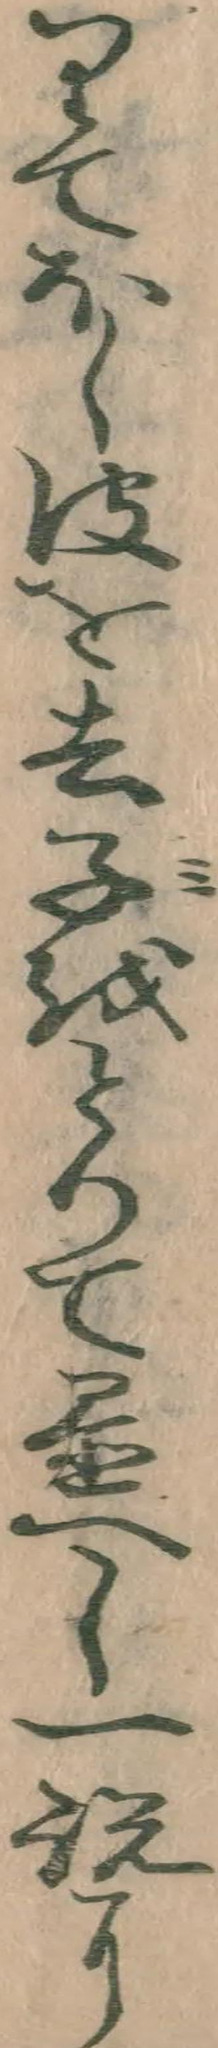りてほし皮を去子をとりて置へし一説に
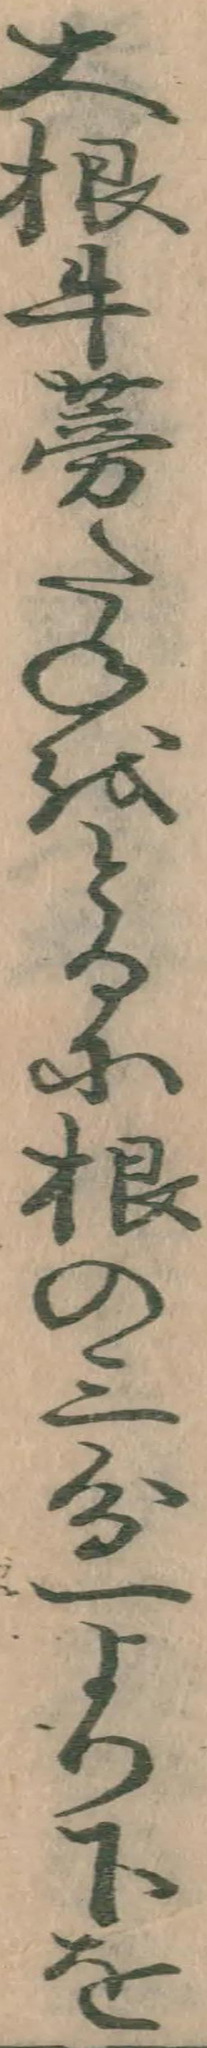大根牛蒡たねをとるに根の三分一より下を
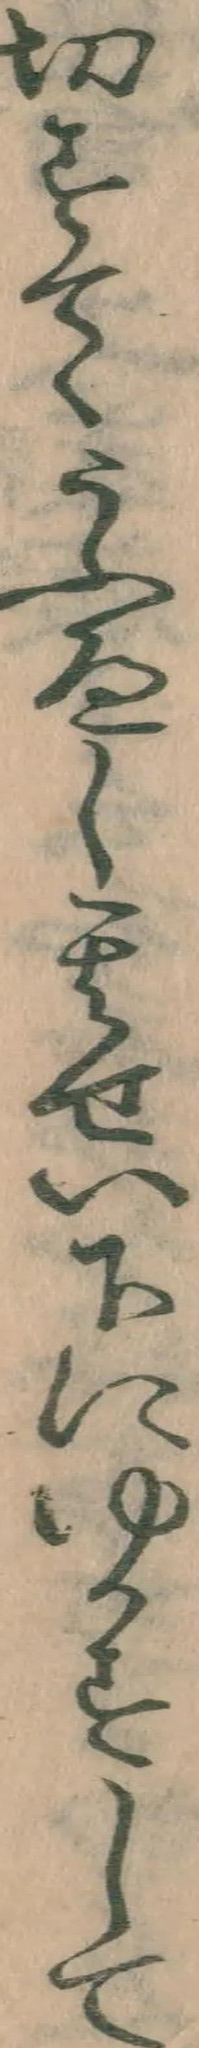切すてゝうふへし其せい下にゆかすして
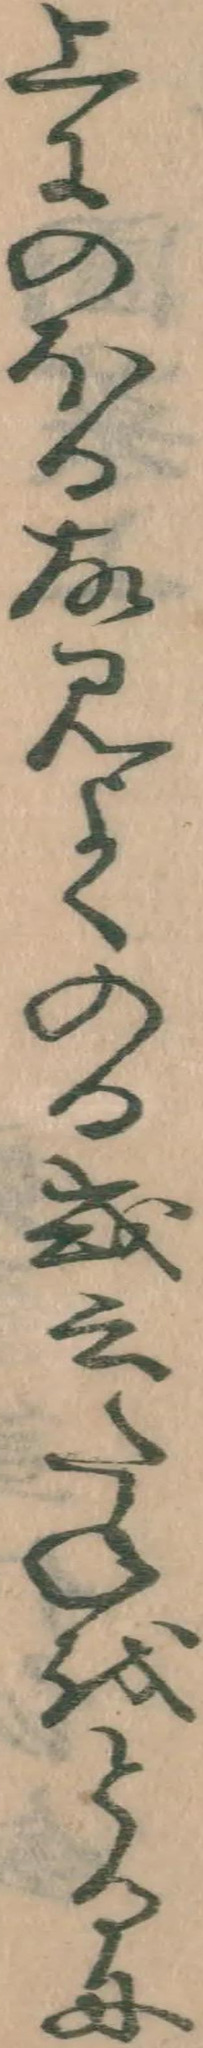上にのほる故見よくのる或云たねをとるに
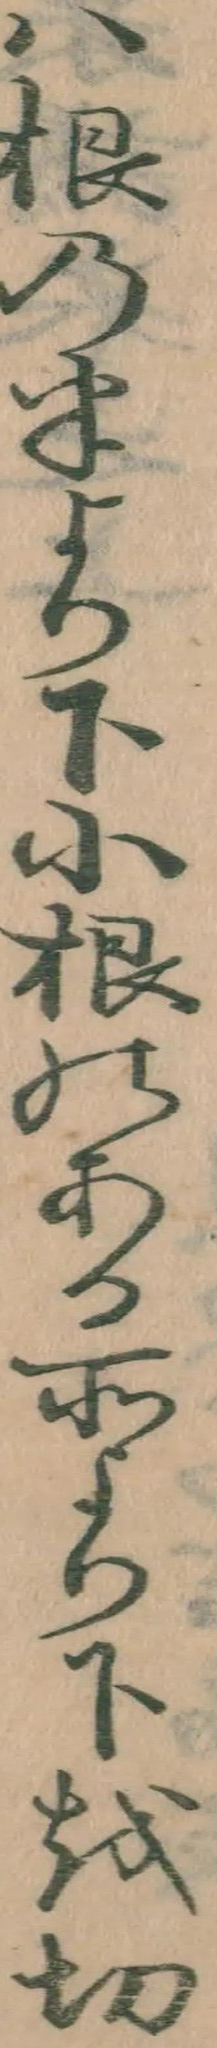は根の半より下小根のある所より下を切
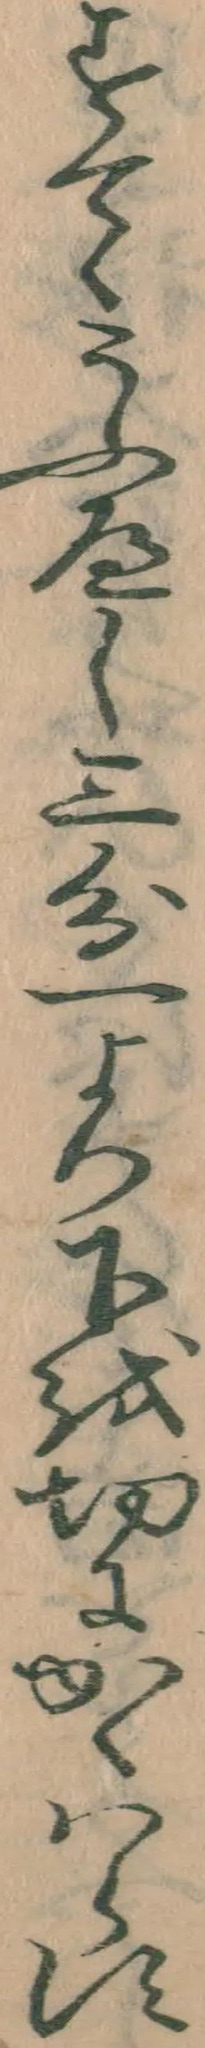すてゝうふへし三分一より下を切にかゝはらす
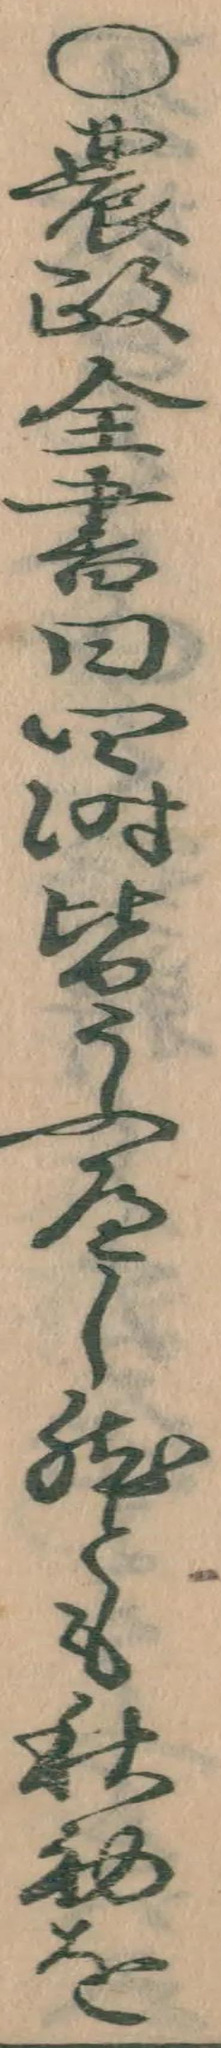〇農政全書曰四時皆うふへし然とも秋初を
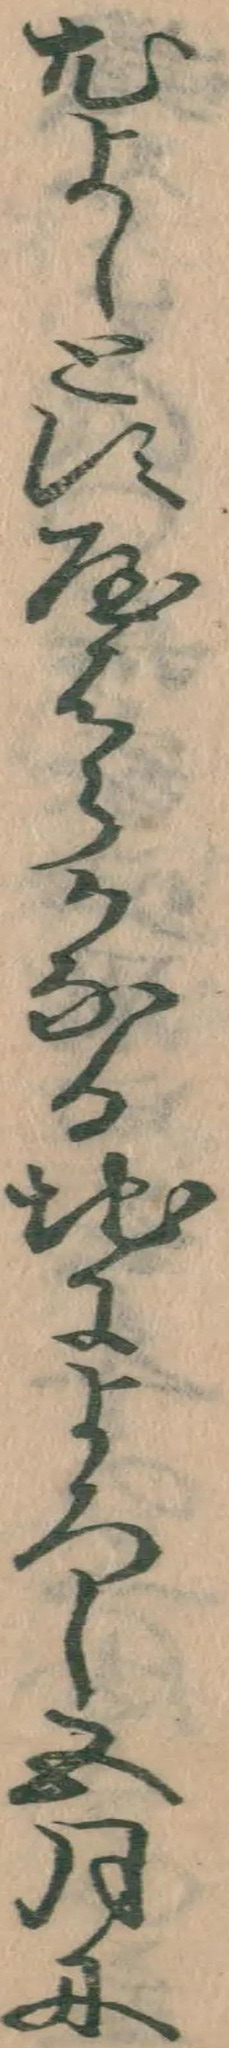尤よしとすやわらかなる地よろし五月に
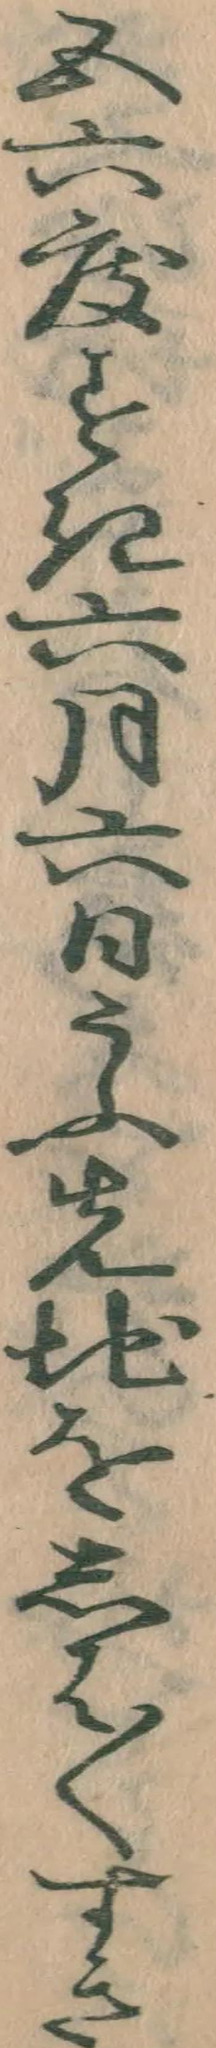五六度すき六月六日うふ先地をしは〳〵すき
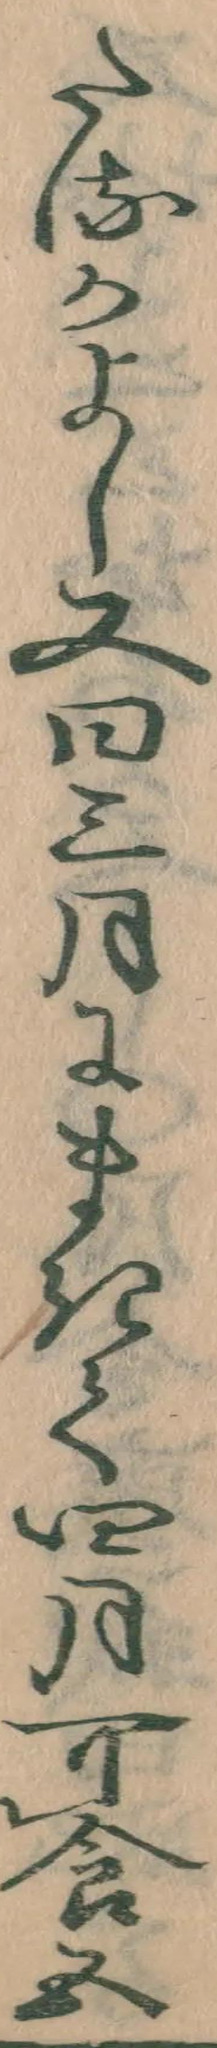たるかよし又曰三月にまきて四月可食五
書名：菜譜 3巻
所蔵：国立国会図書館 National Diet Library, JAPAN
